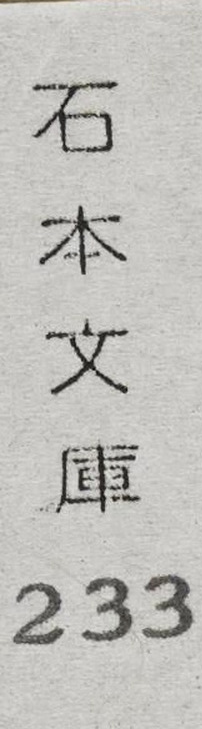石本文庫

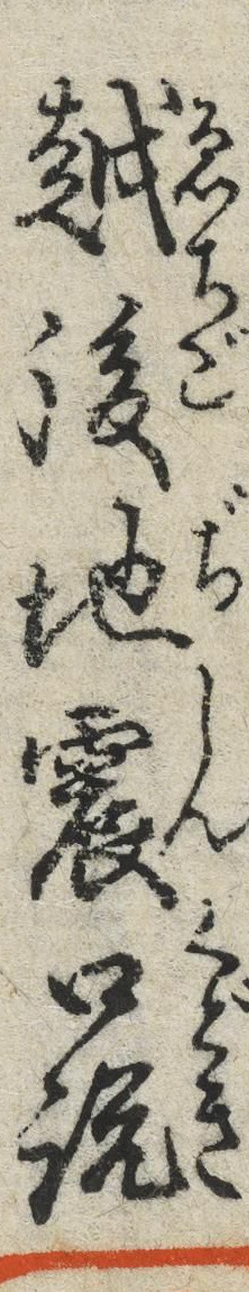越後地震口説
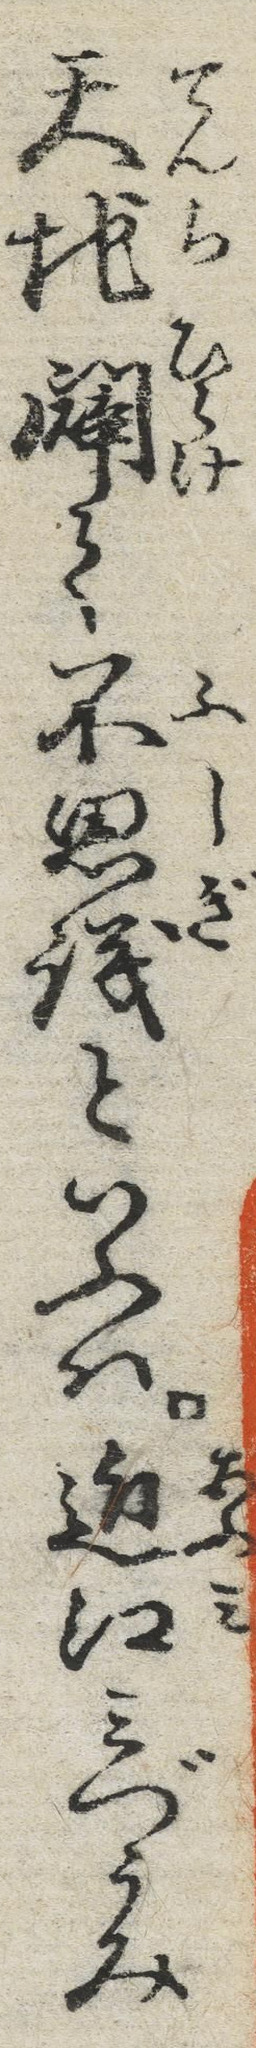天地開て不思議といふは。近江みづうみ
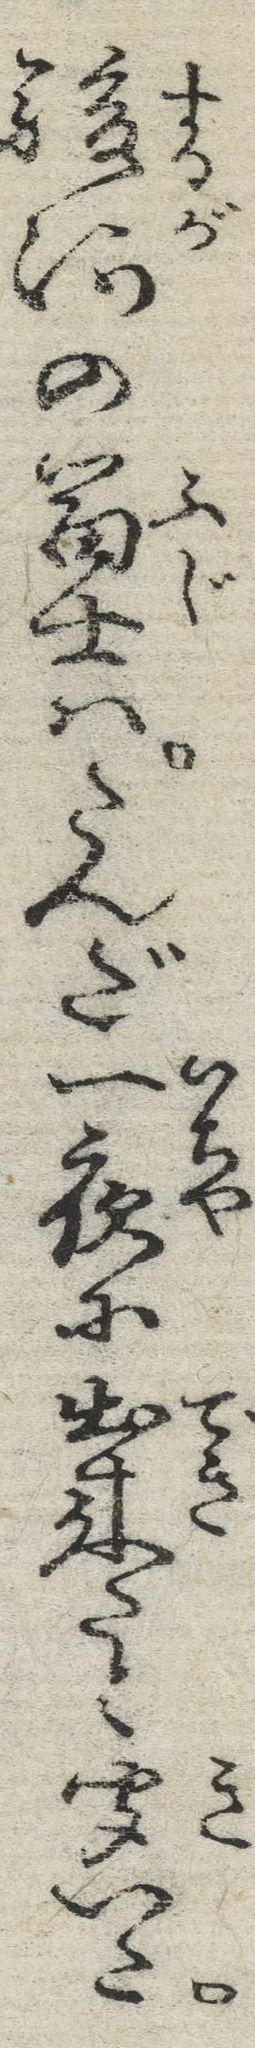駿河の富士は。たんだ一夜に出来たと聞いた。
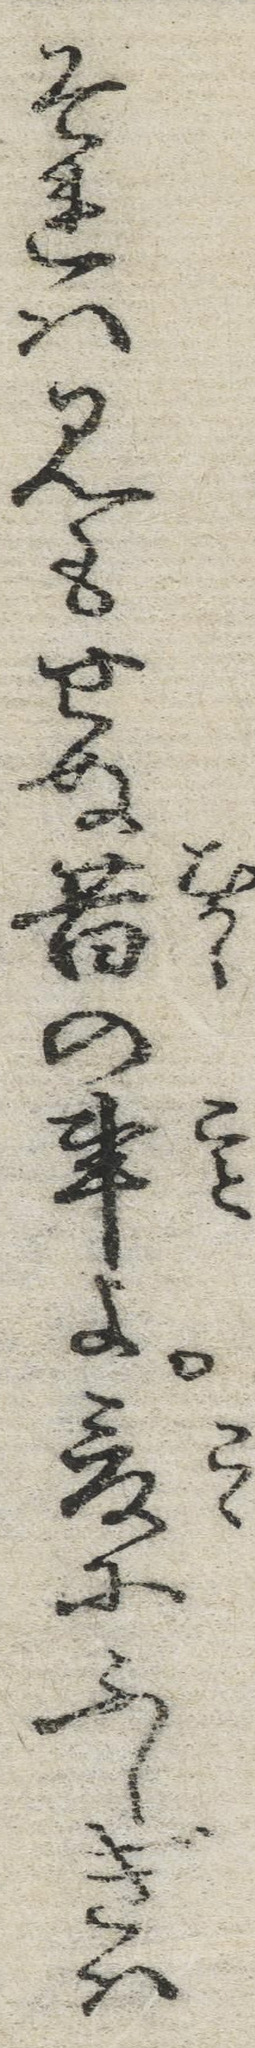それは見もせぬ昔の事よ。爰にふしぎは
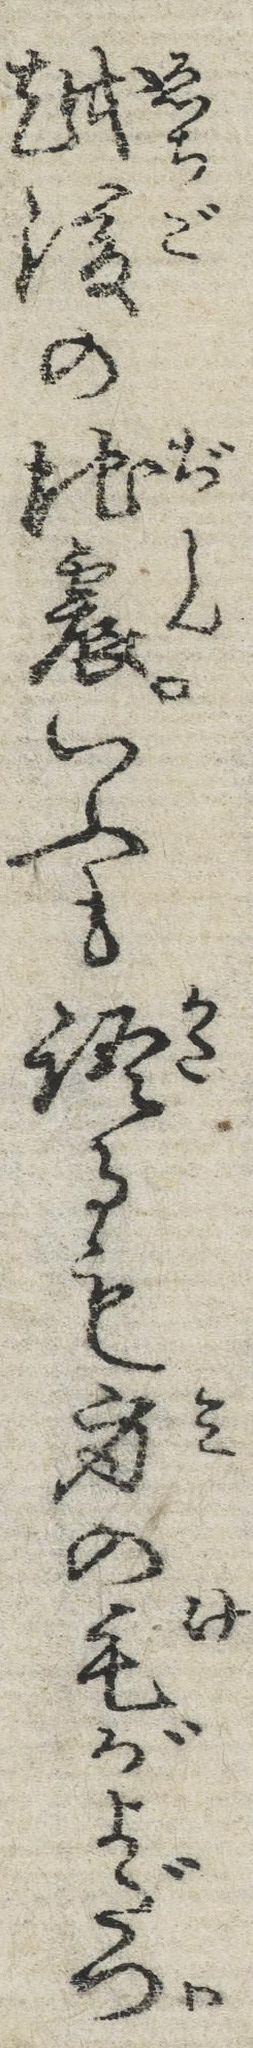越後の地震。いふも語るも身の毛がよだつ。
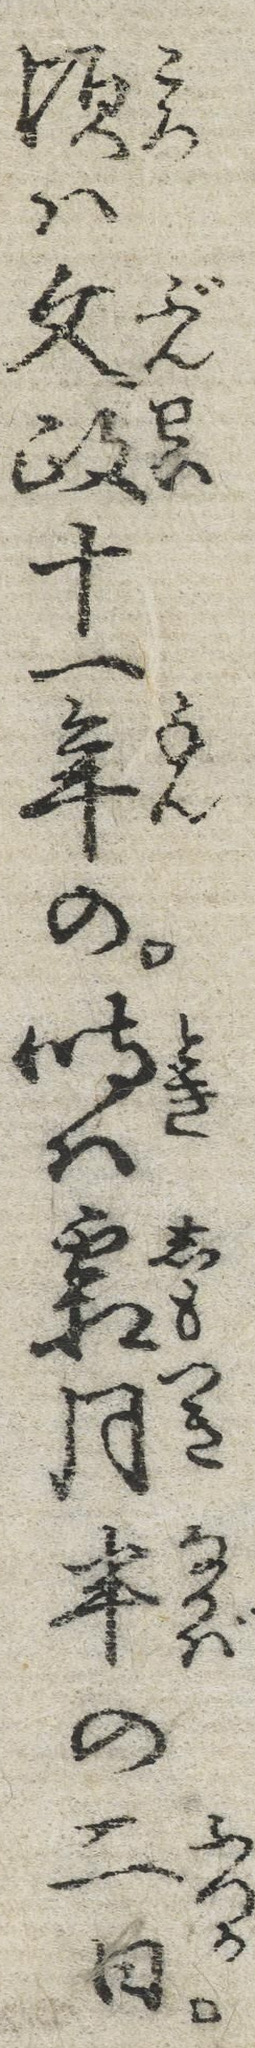頃は文政十一年の。時は霜月半の二日。
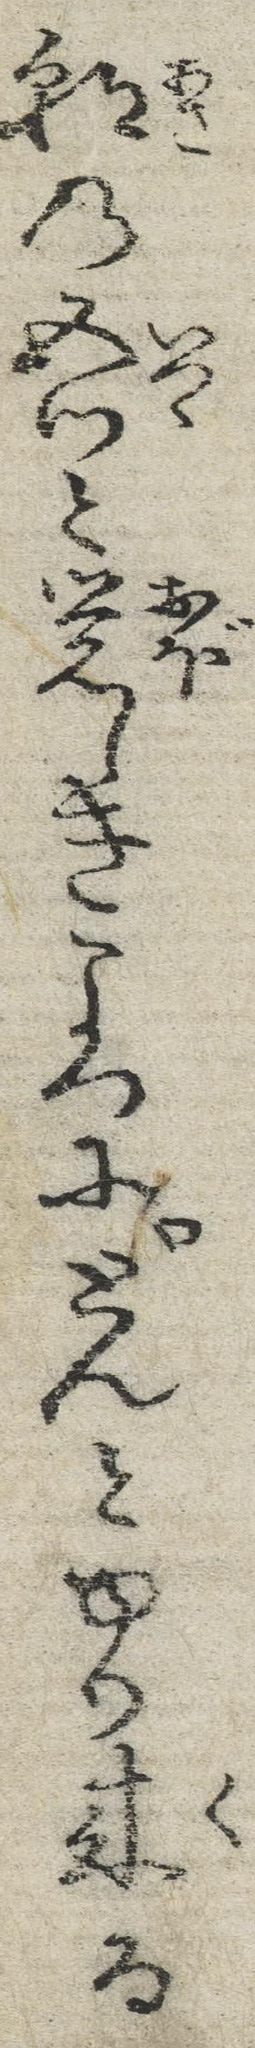朝の五つと覚しきころに。とんとゆり来る

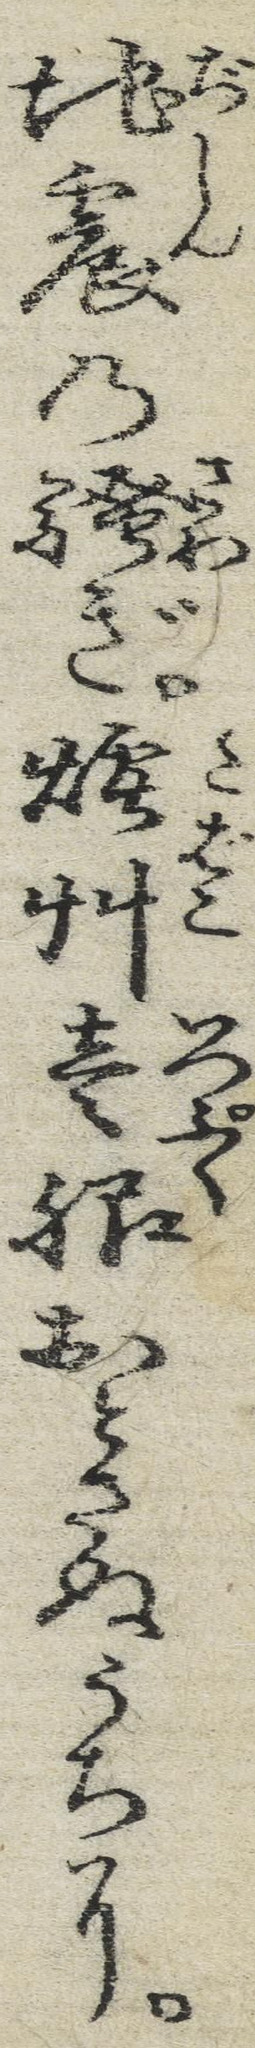地震の騒ぎ。煙草壱服おとさぬうちに。
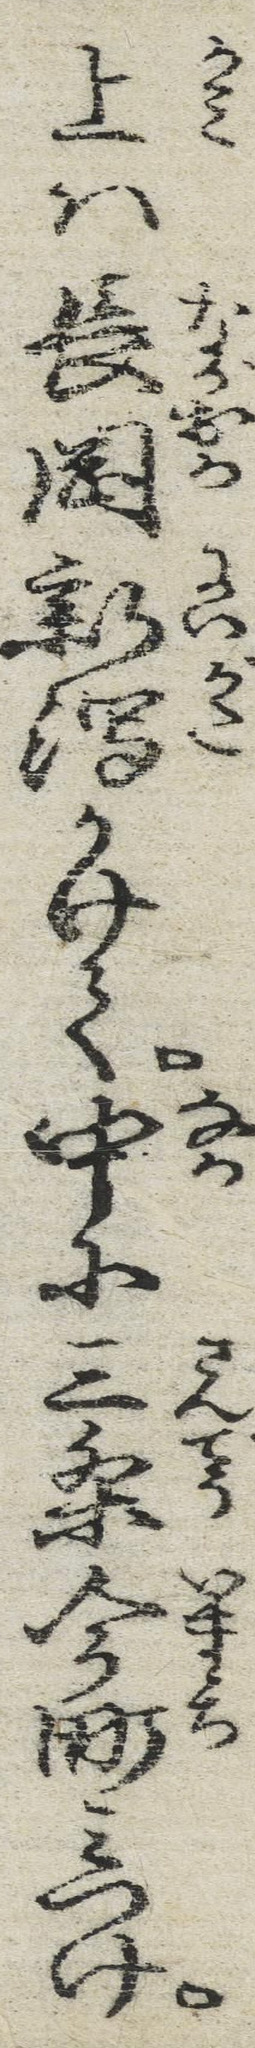上は長岡新潟かけて。中に三条今町みつけ。
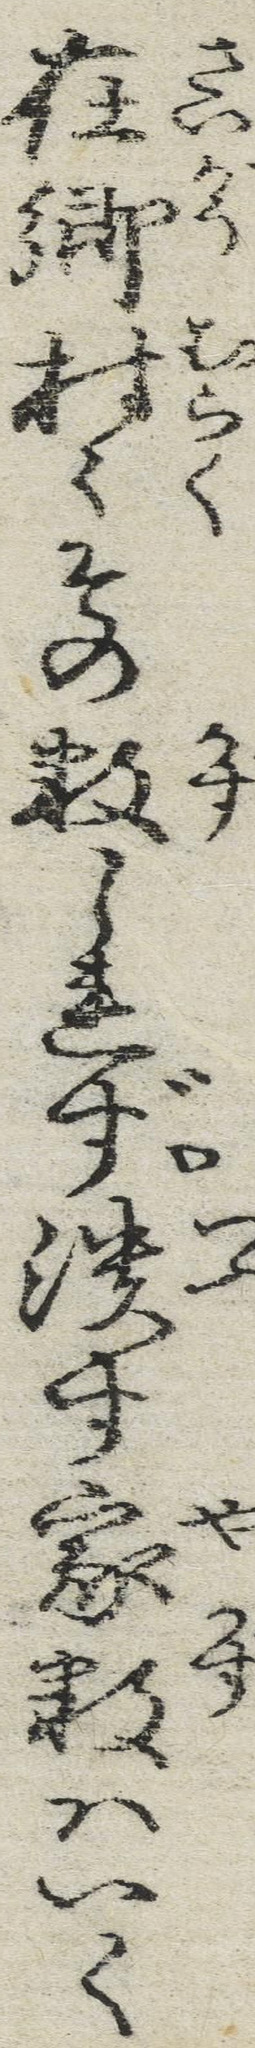在郷村々その数しれず。潰す家数はいく
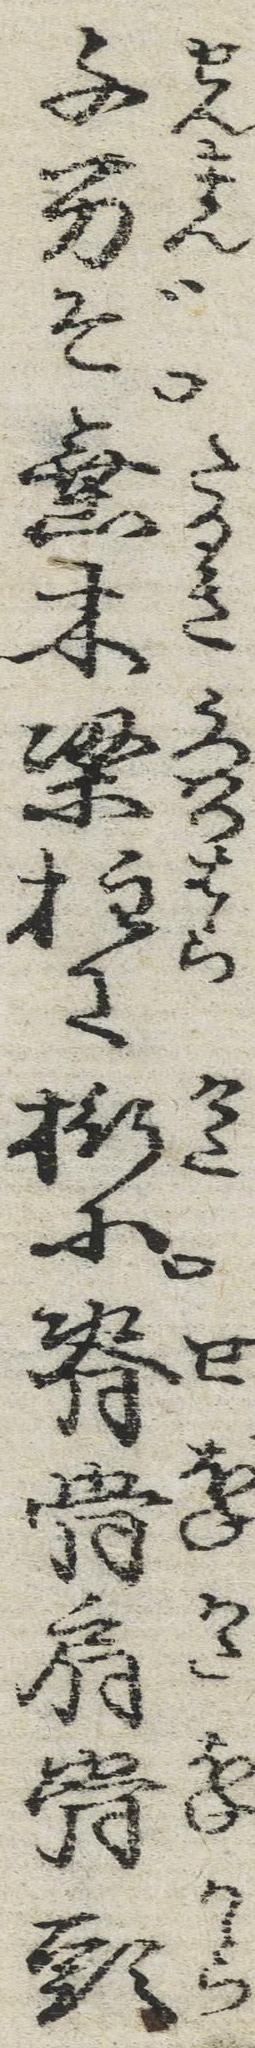千万ぞ。垂木梁柱に桁に。背骨肩骨頭
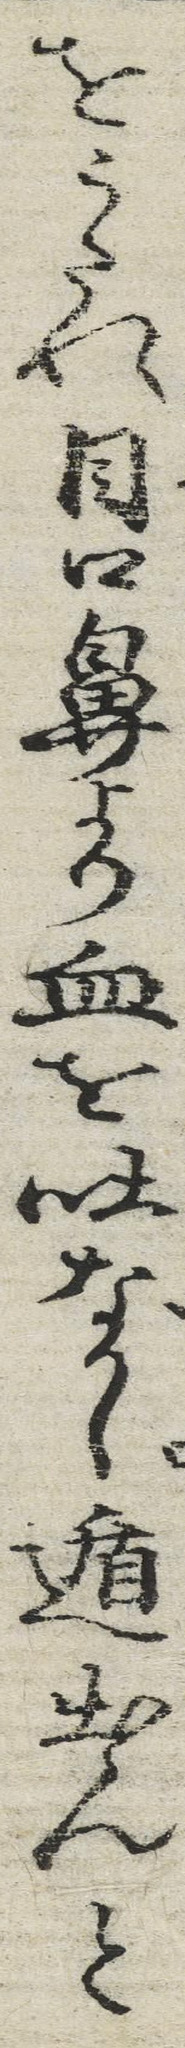をうたれ。目口鼻より血を吐ながし。遁出んと
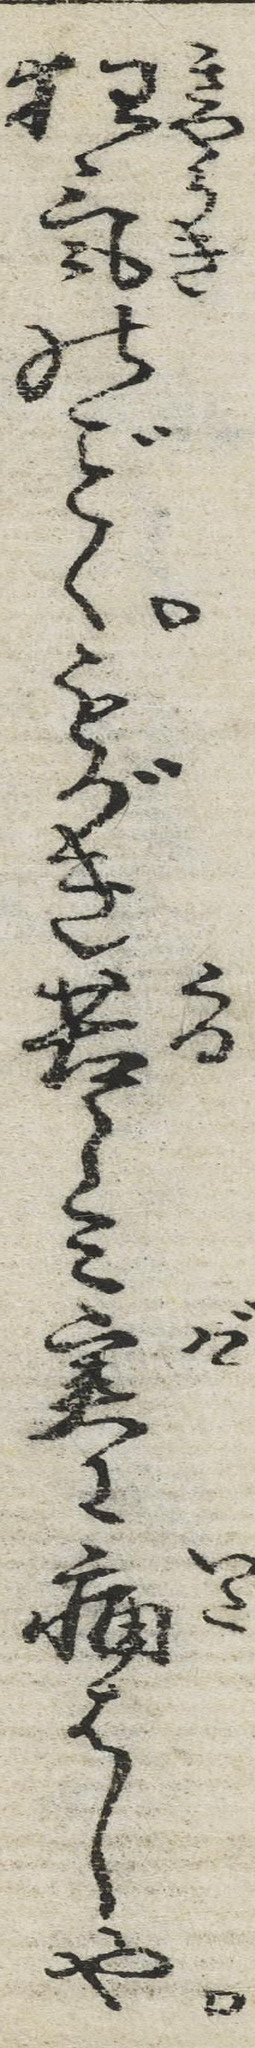狂気のごとく。もがき苦しみ実に痛はしや。
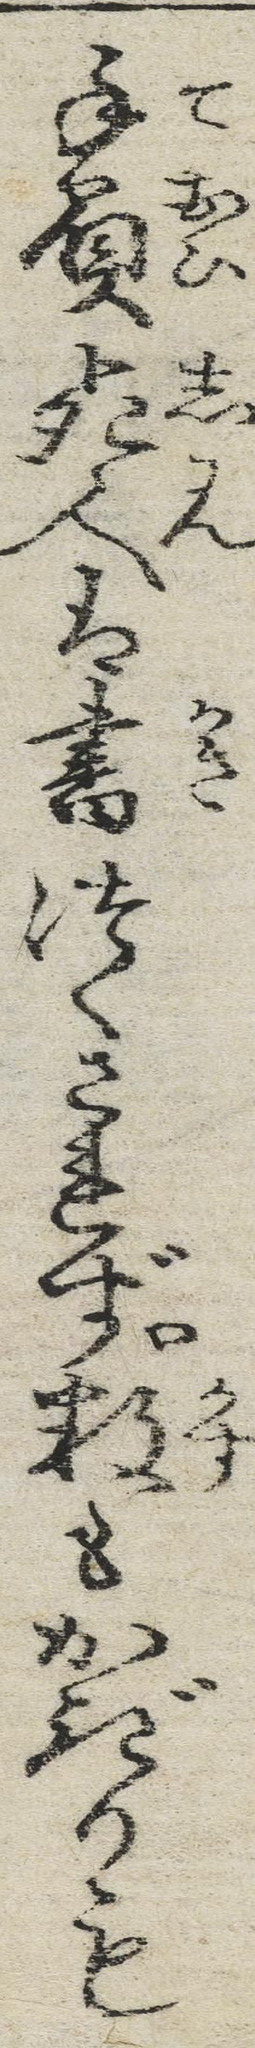手負死人は書つくされず。数もかぎりも
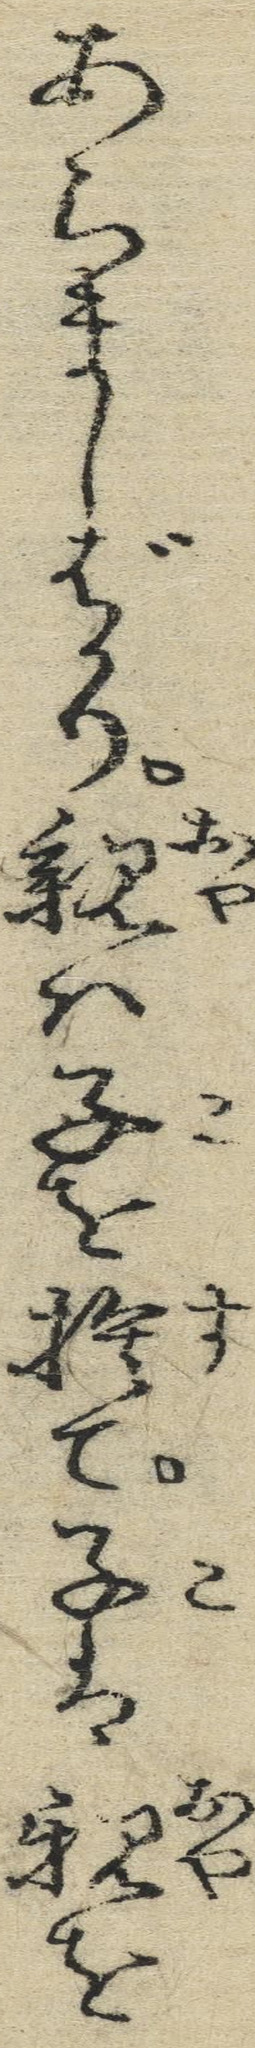あらましばかり。親は子を捨て。子は親を
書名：越後地震口説
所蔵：東京大学地震研究所図書室 Earthquake Research Institute Library, The University of Tokyo, JAPAN
